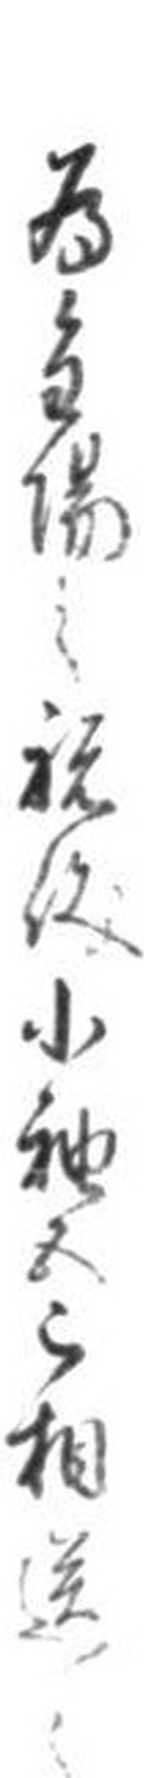為重陽之祝儀小袖五被相送之
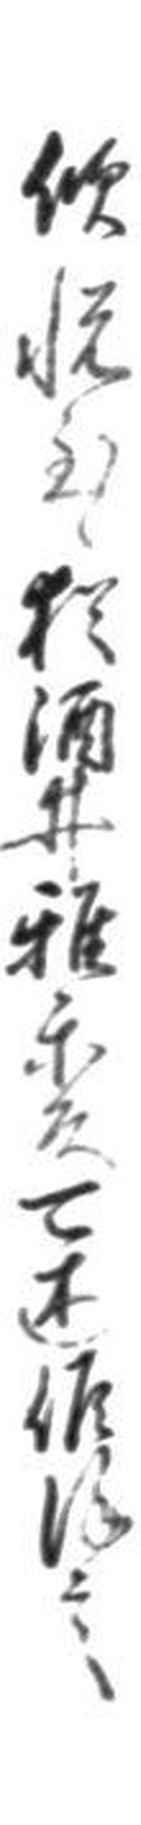欣悦至候猶酒井雅楽頭可述候謹言
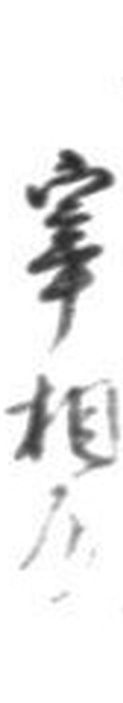宰相殿
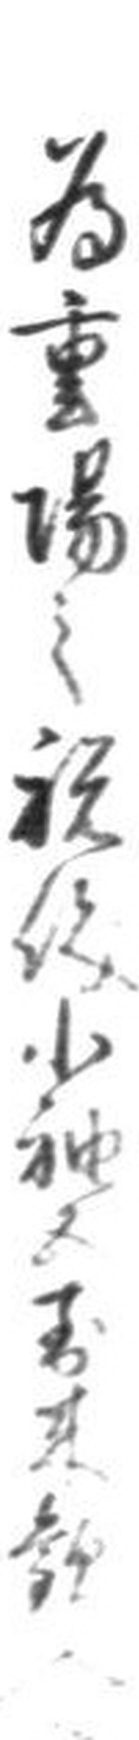為重陽之祝儀小袖五被相送之
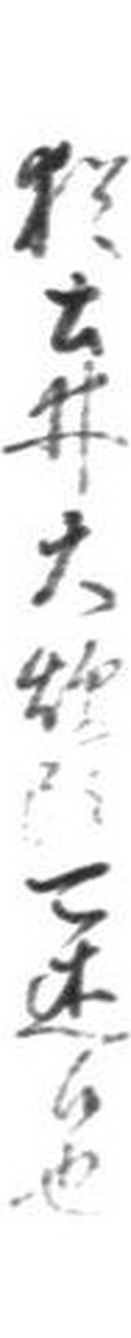猶土井大炊頭可述候也
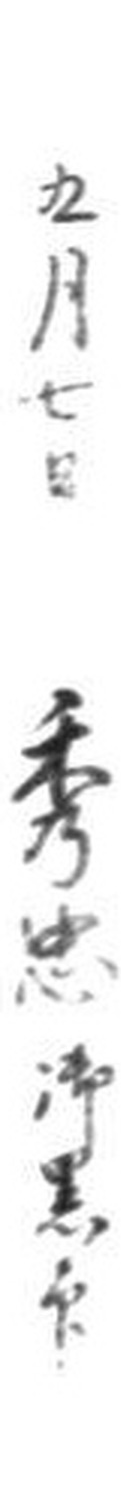九月七日秀忠御黒印

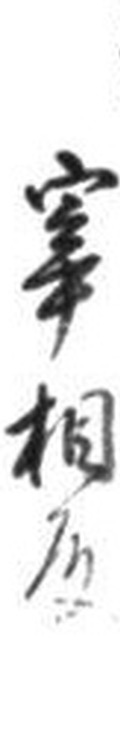宰相殿
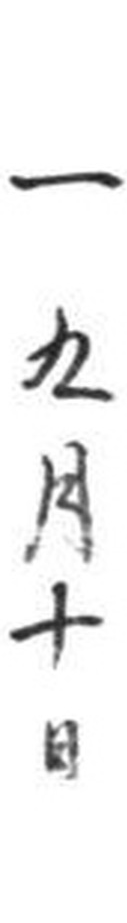一九月十日
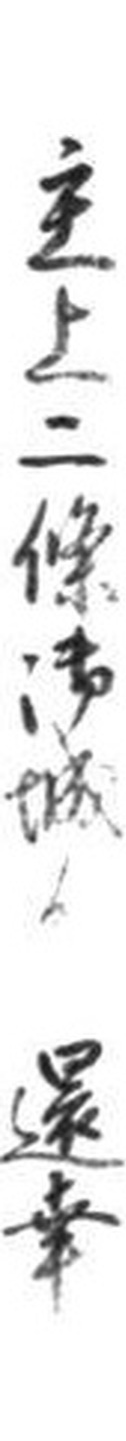主上二条御城ゟ還幸
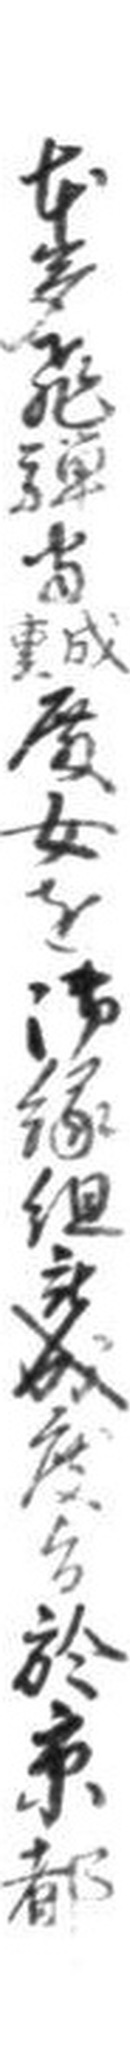本多飛騨守成重殿女を御縁組被成度旨於京都
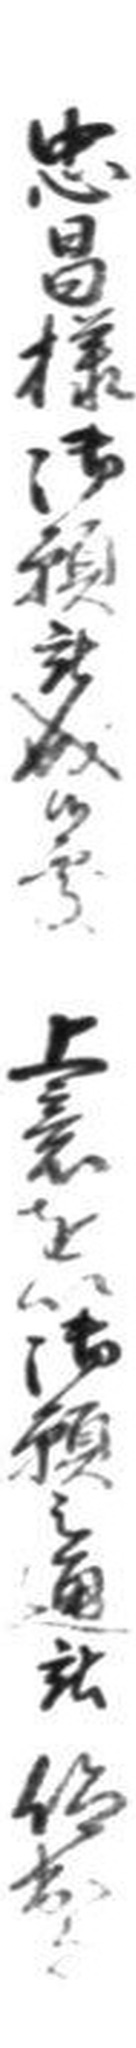忠昌様御願被成候処上意を以御願之通被仰出之
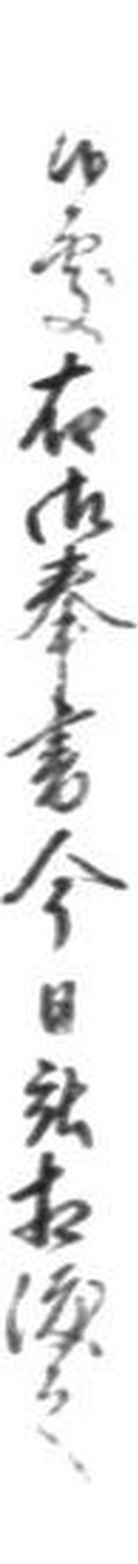候処右御奉書今日被相渡之
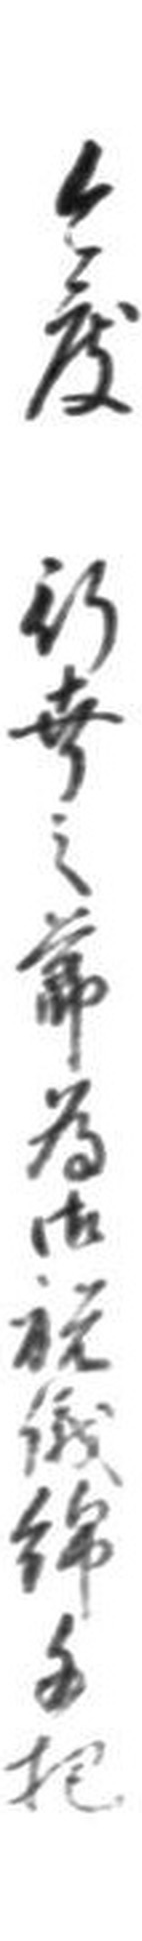今度行幸之節為御祝儀綿千把
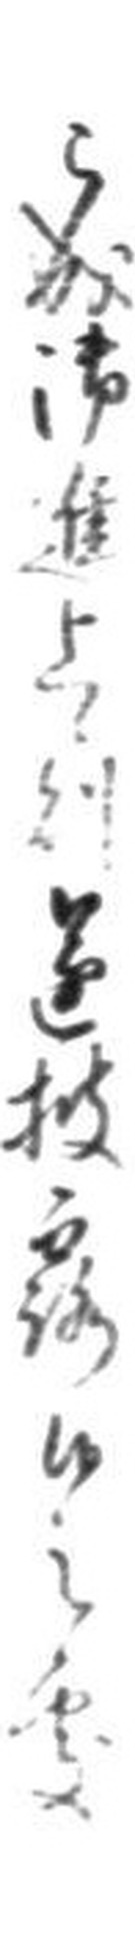被成御進上候則遂披露候之処
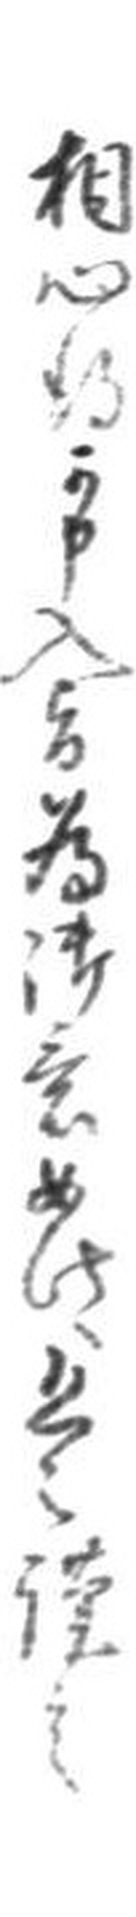相心得可申入旨為御意如此候恐々謹言
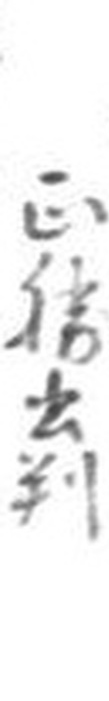正勝書判
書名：家譜 三 忠昌公 従慶長八年到寛永六年
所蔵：福井県文書館 Fukui Prefectural Archives
